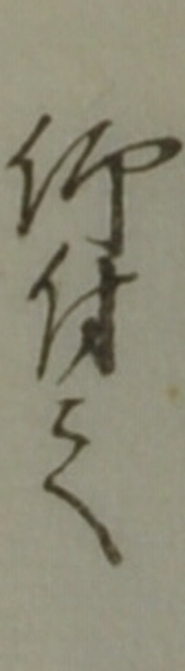仰付之
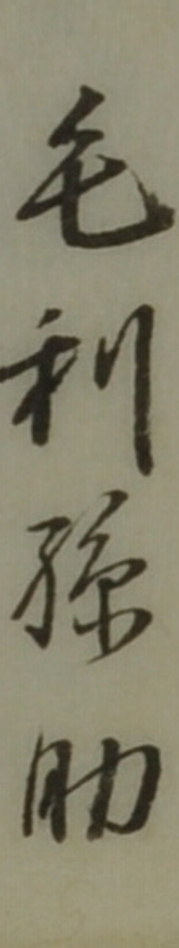毛利孫助
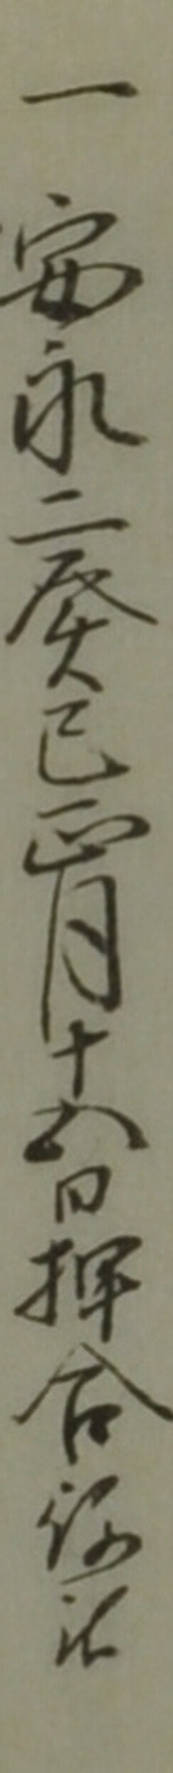一安永二癸巳正月十五日押合役被
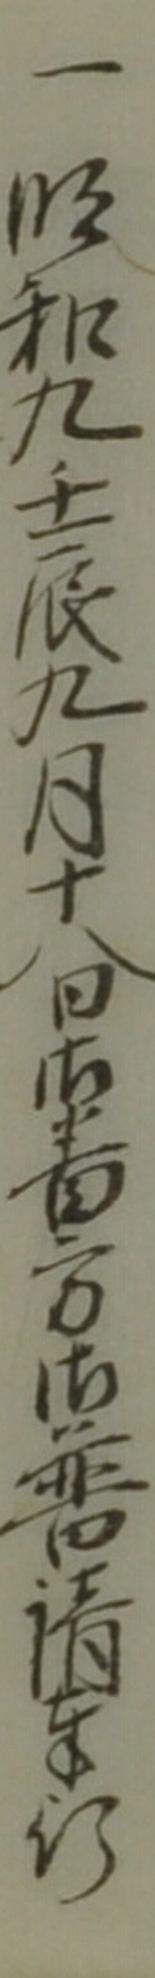一明和九壬辰九月十八日御番方御普請奉行
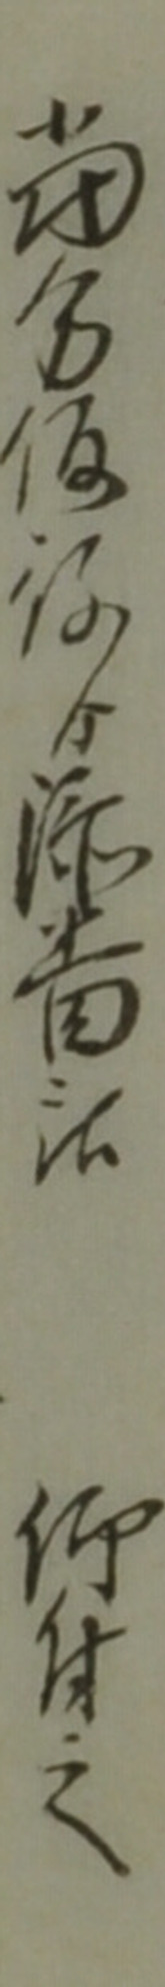当分仮役より添番被仰付之
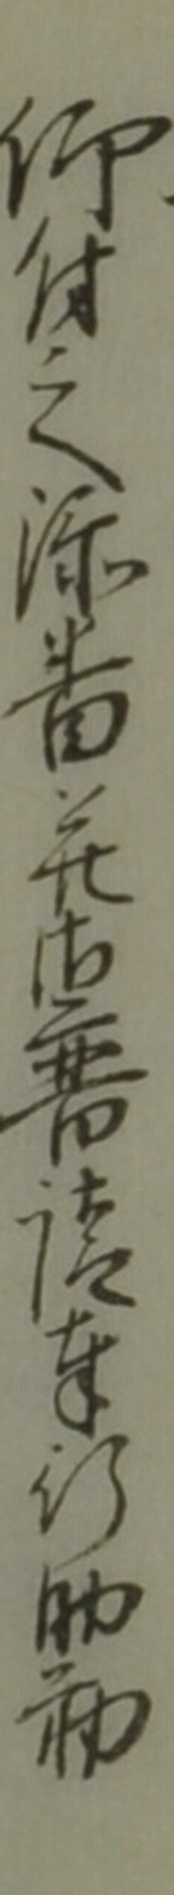仰付之添番并御普請奉行助勤
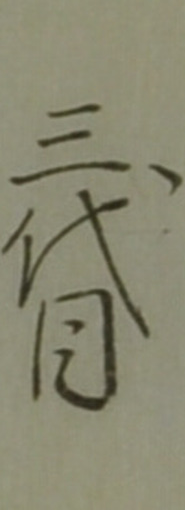三代目
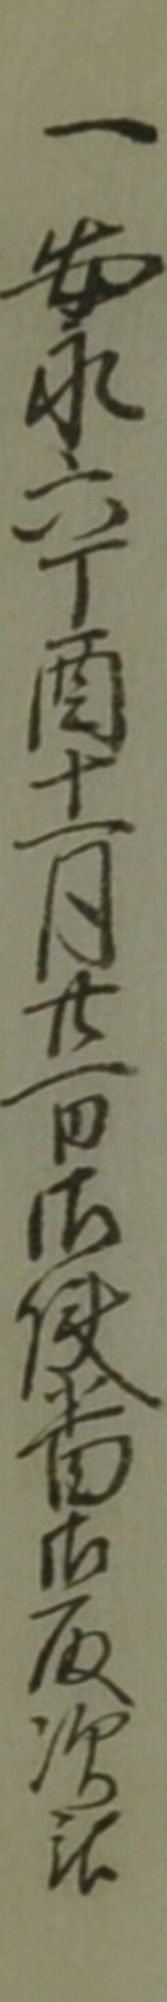一安永六丁酉十一月廿一日御使番御取次被
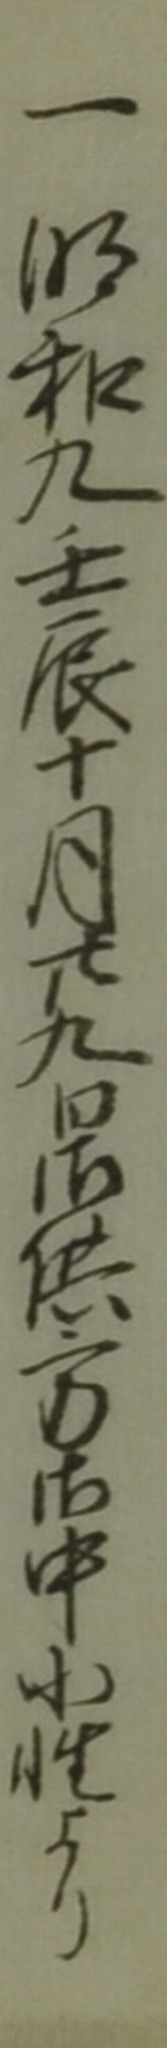一明和九壬辰十月廿九日御供方御中小姓より
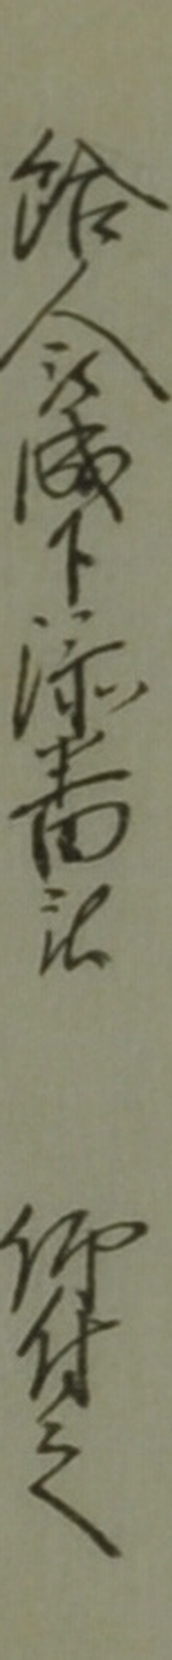給人被成下添番被仰付之
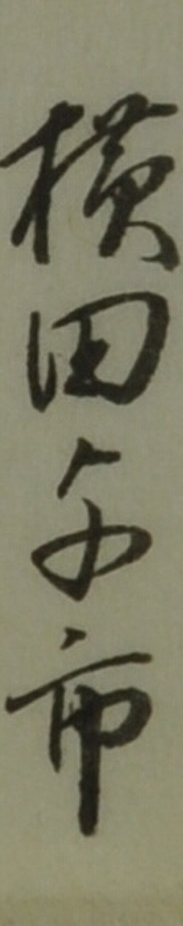横田与市
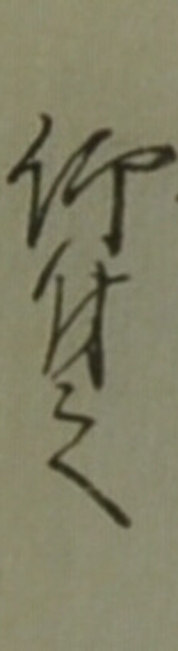仰付之
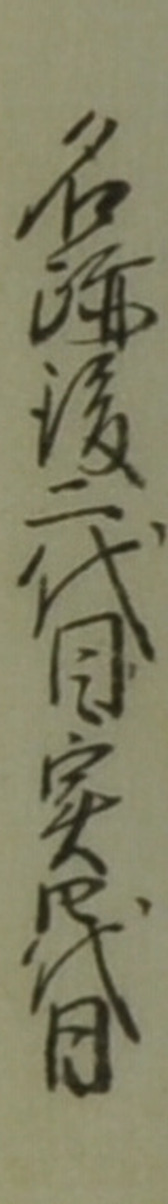名跡後二代目実四代目

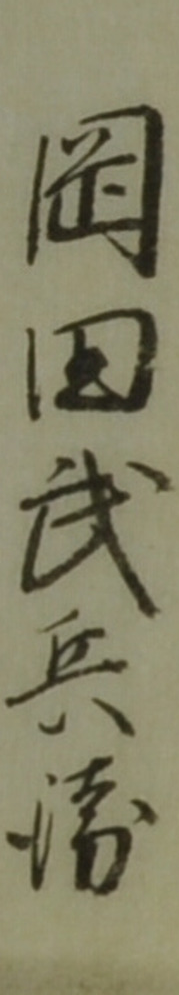岡田武兵衛
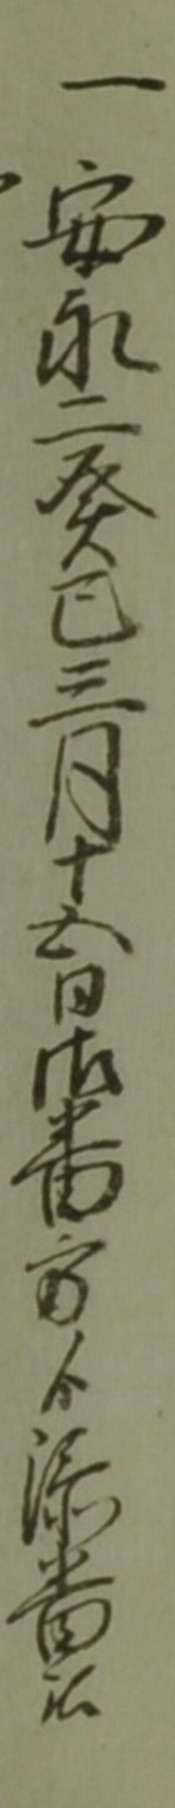一安永二癸巳三月十五日御番方より添番被
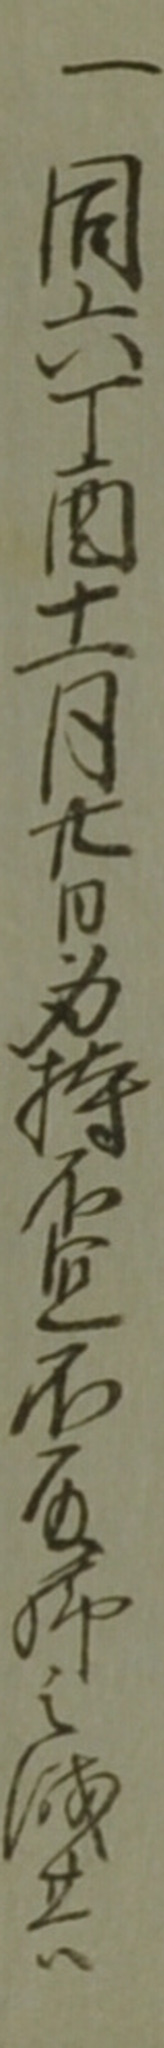一同六丁酉十一月廿日身持不宜不取締之賊共
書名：諸御役代々録（八）
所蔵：伊那市立高遠町図書館・合同会社AMANE
